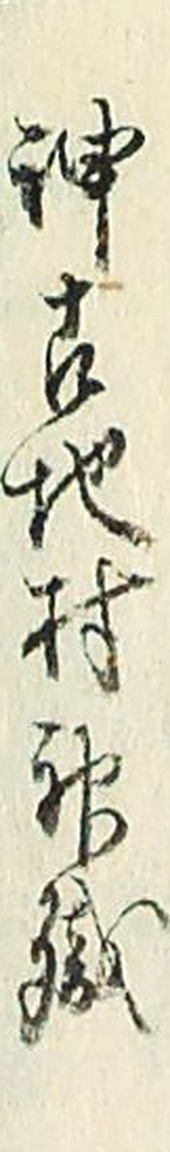神古地村神職
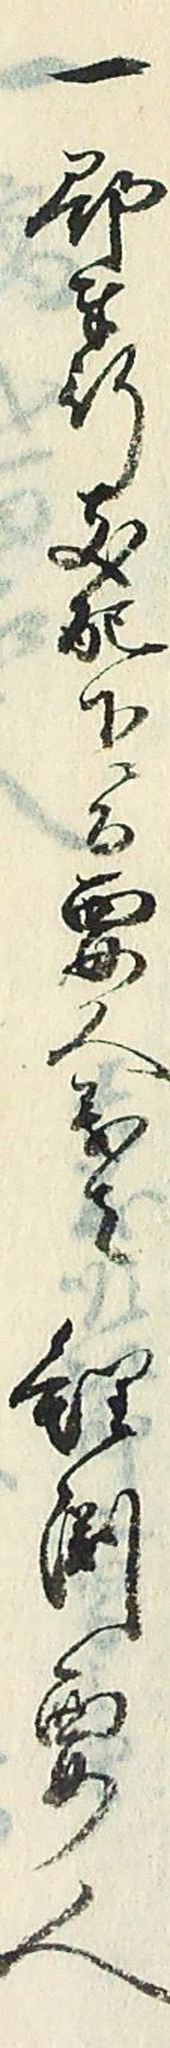一郡奉行支配下ニ而要人義者鯉渕要人
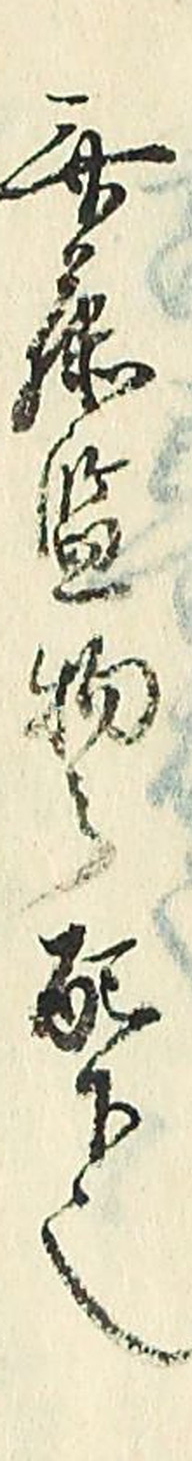斉藤監物之配下也
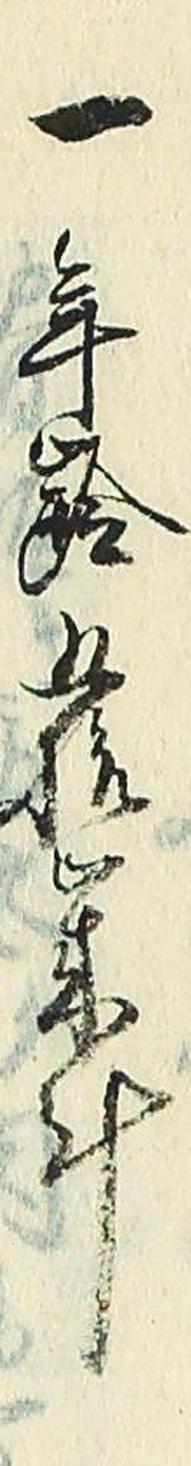一年齢五拾歳計
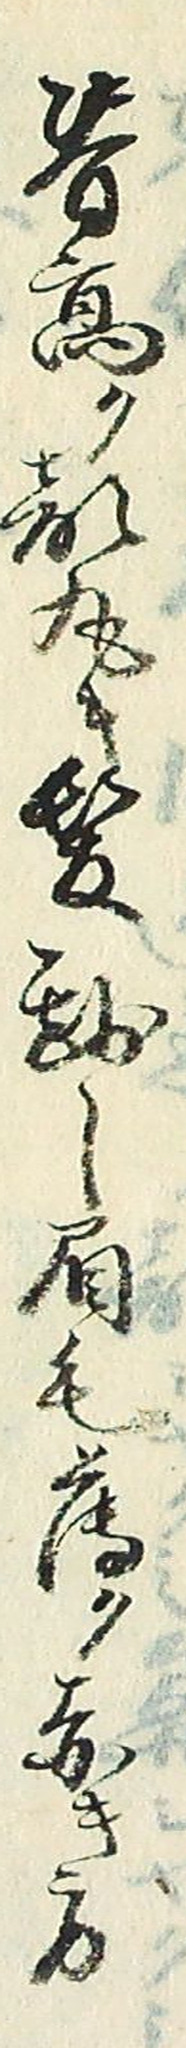背高ク顔丸キ髪尠し眉毛薄ク赤キ方
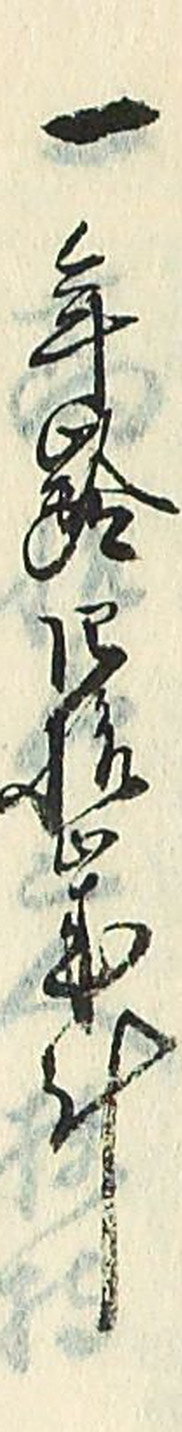一年齢五拾歳計
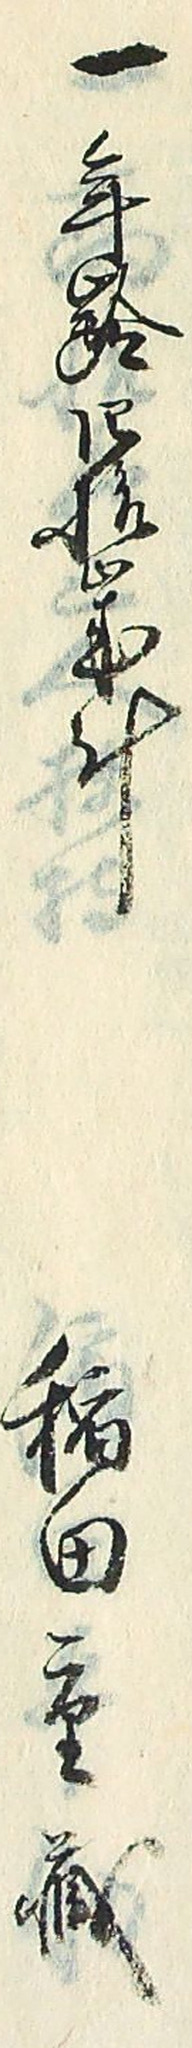一年齢四拾歳計稲田重蔵
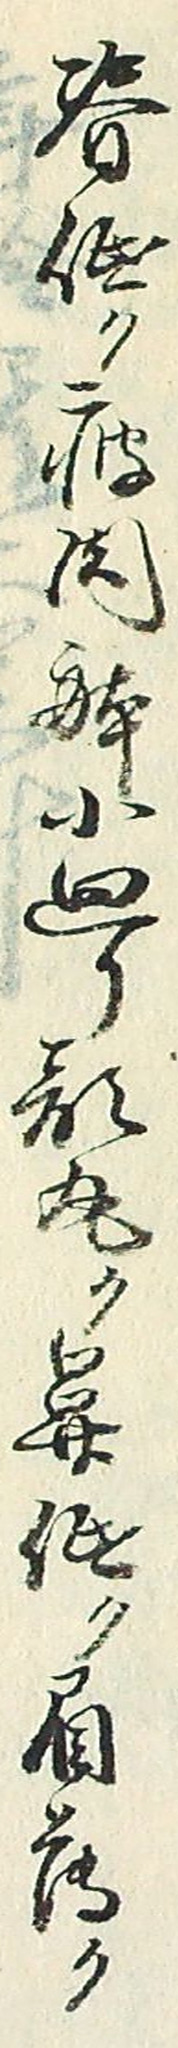脊低ク痩肉躰小廻り顔丸ク鼻低ク眉薄ク
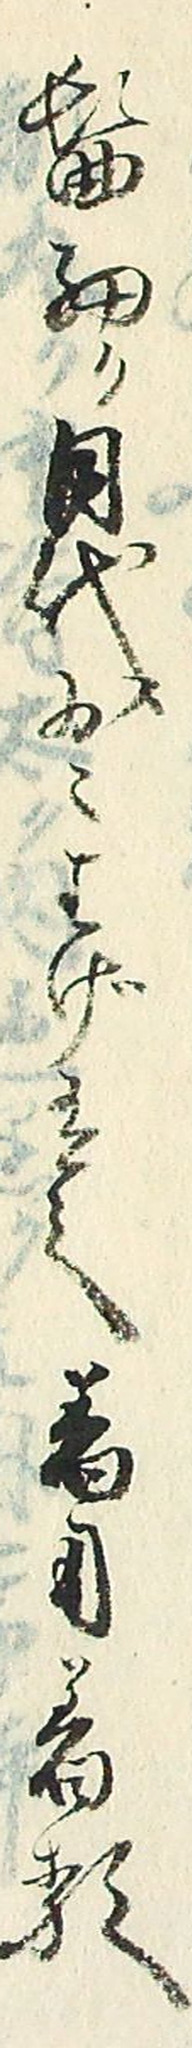髷細ク月代少々はげ有之着用着類
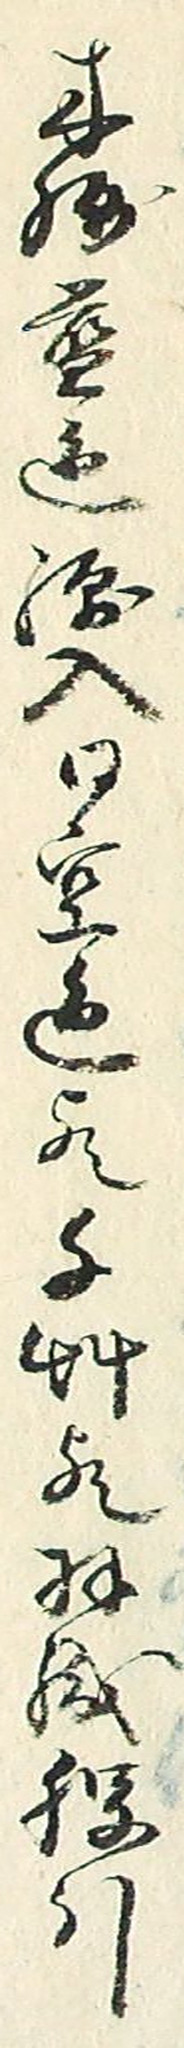木綿藍色綿入同空色歟千艸歟羽織股引

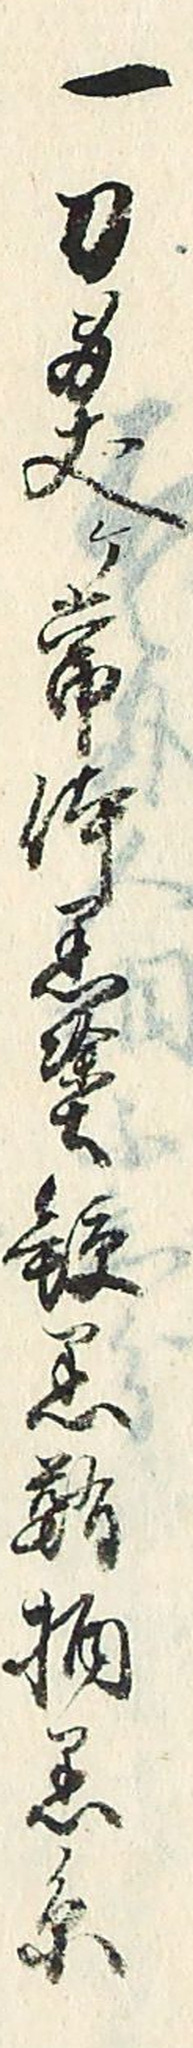一刀身丈ケ常体黒塗鮫黒鞘柄黒糸
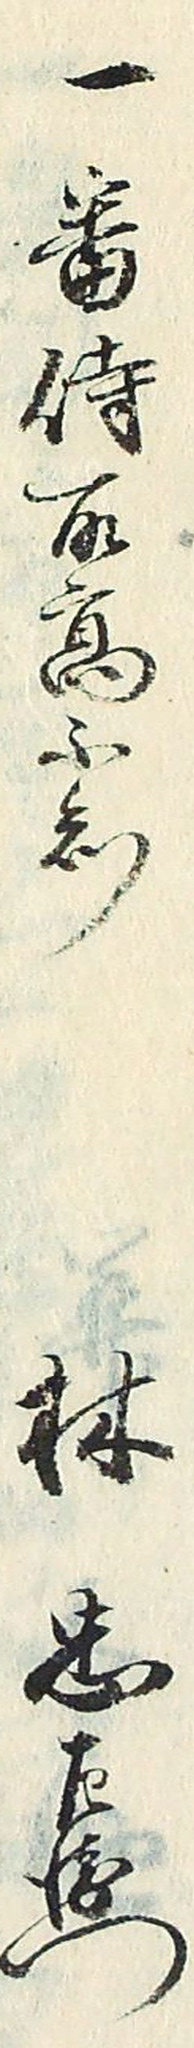一番侍取高不知林忠左衛門
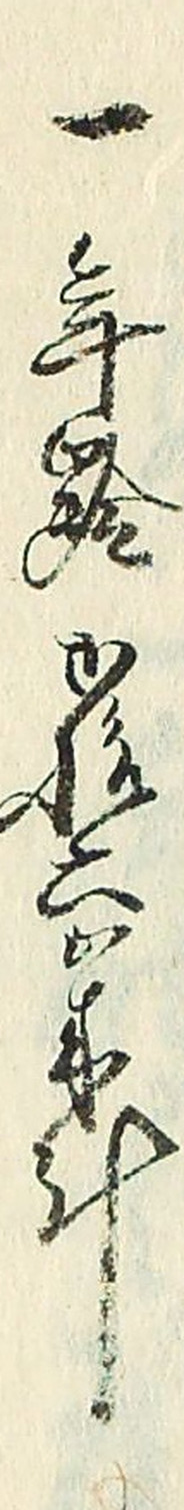一年齢弐拾六歳計
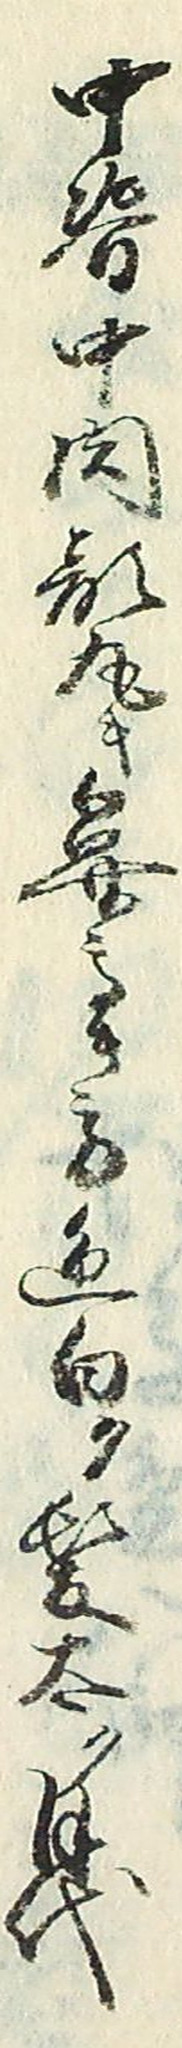中脊中肉顔丸キ鼻高キ方色白ク髪太ク月代
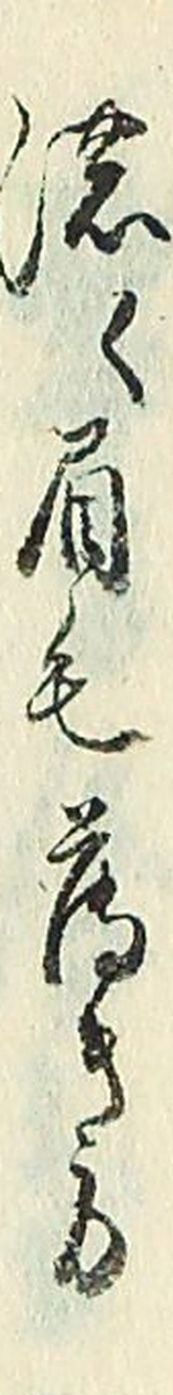濃く眉毛薄キ方
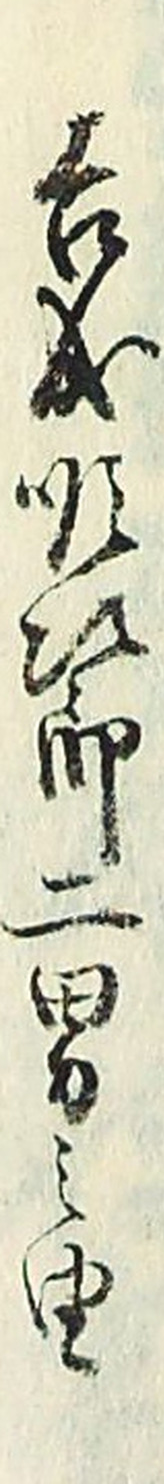吉成順次郎二男之由
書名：諸御趣意書并御下知向之写
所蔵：鳴門教育大学 Naruto University of Education
